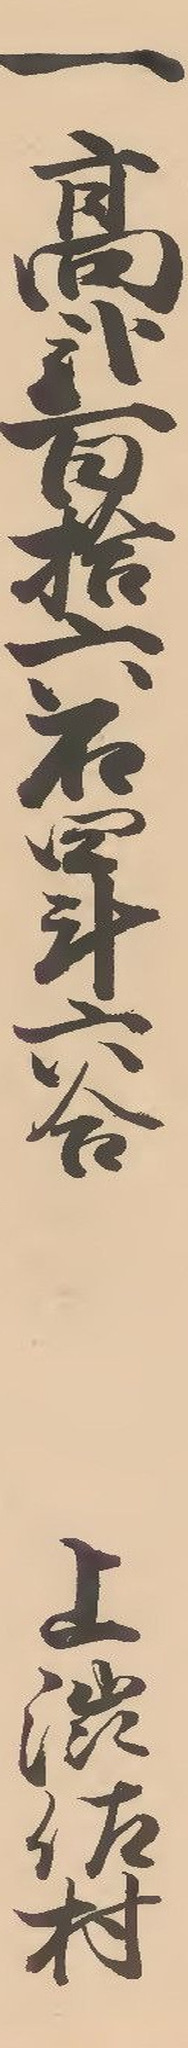一高弐百拾六石四斗六合上渋佐村

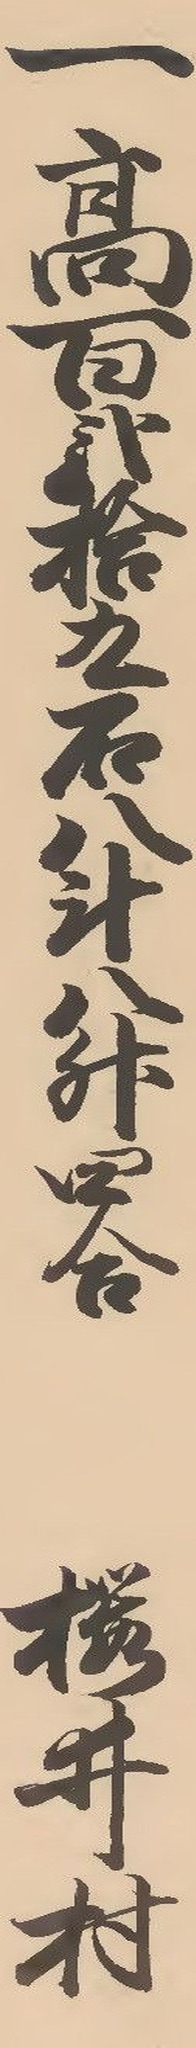一高百弐拾九石八斗八升四合桜井村
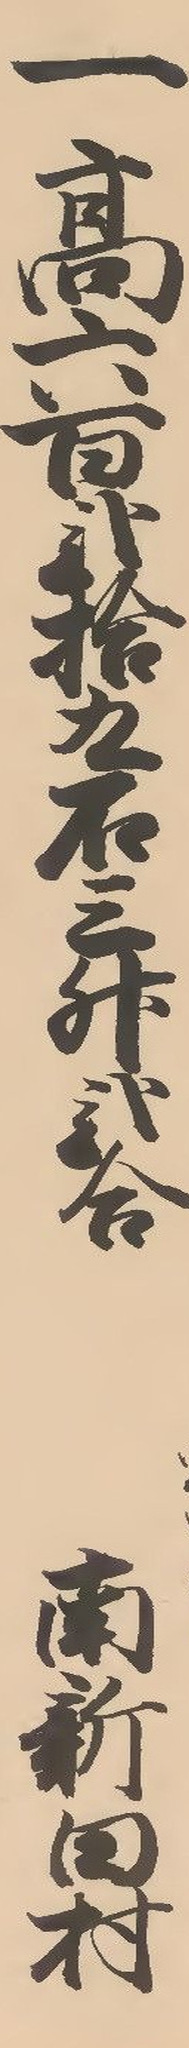一高六百弐拾九石三升弐合南新田村
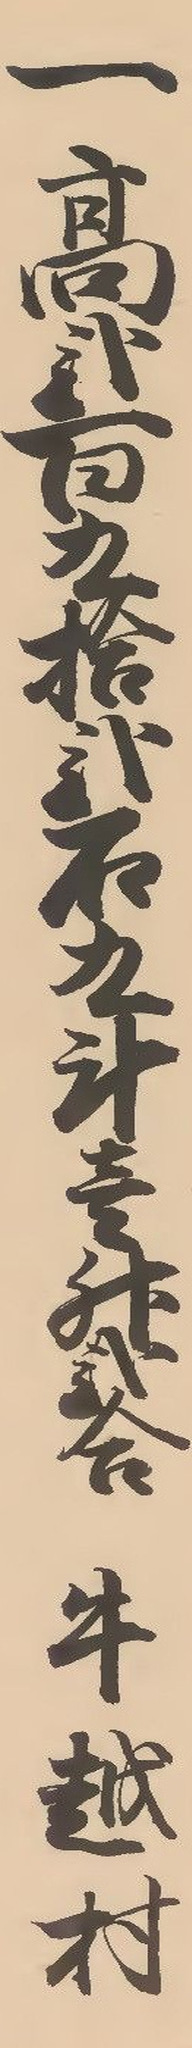一高弐百九拾弐石九斗壱升弐合牛越村
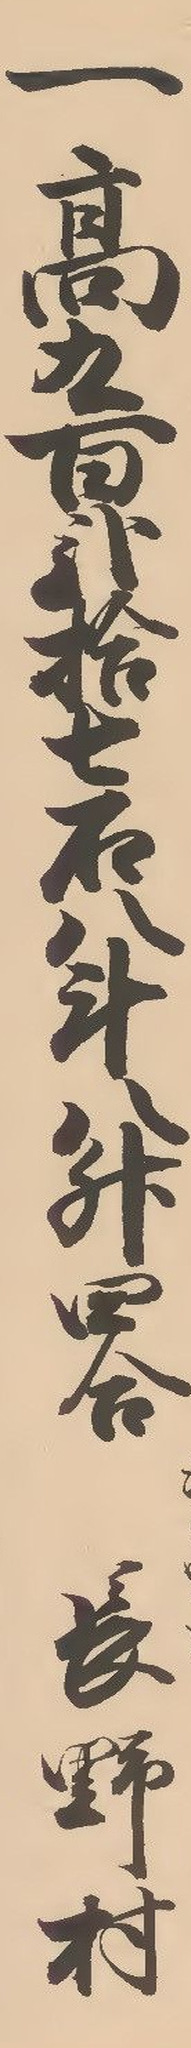一高九百弐拾七石八斗八升四合長野村
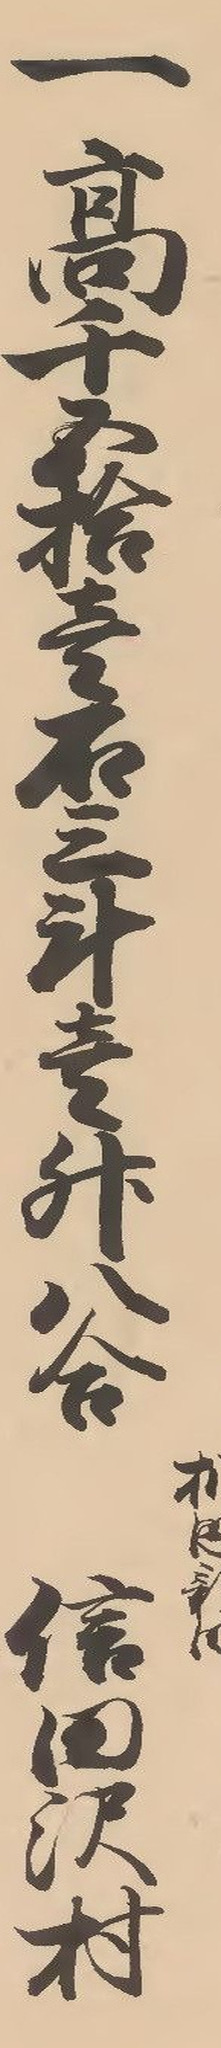一高千五拾壱石三斗壱升八合信田沢村
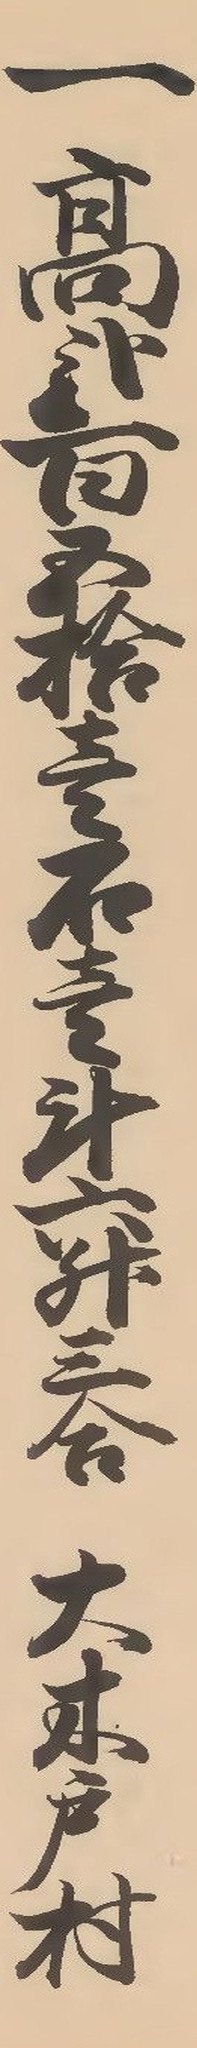一高弐百五拾壱石壱斗六升三合大木戸村
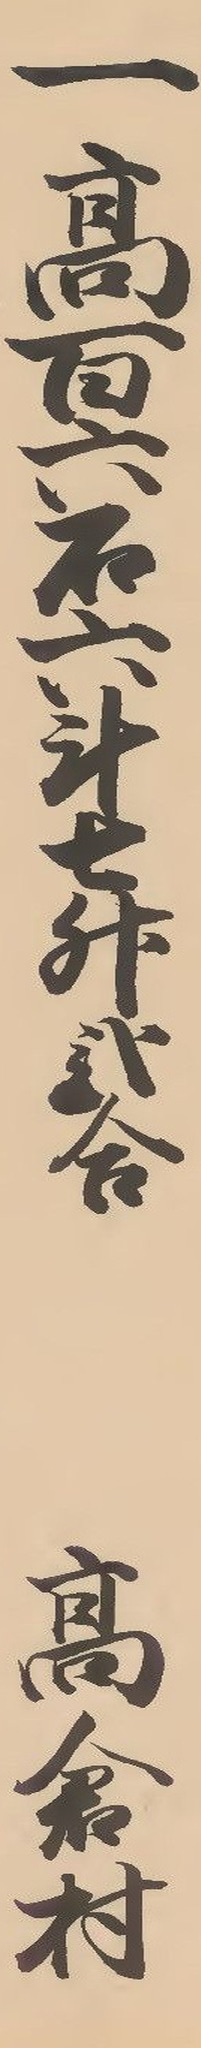一高百六石六斗七升弐合高倉村
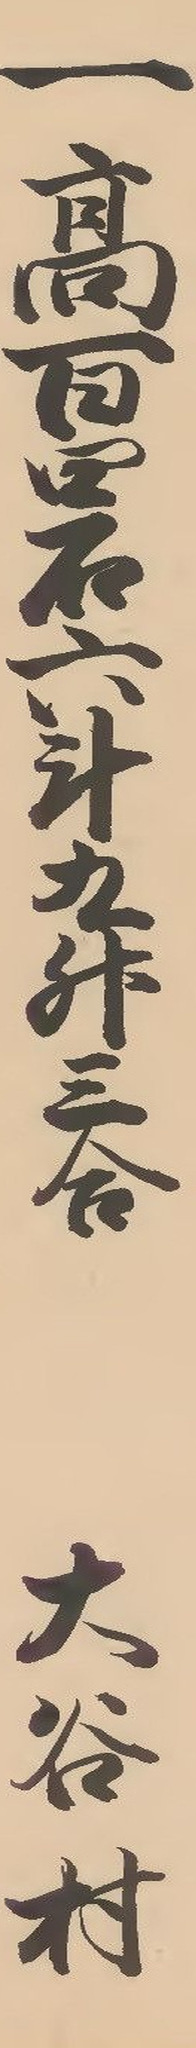一高百四石六斗九升三合大谷村

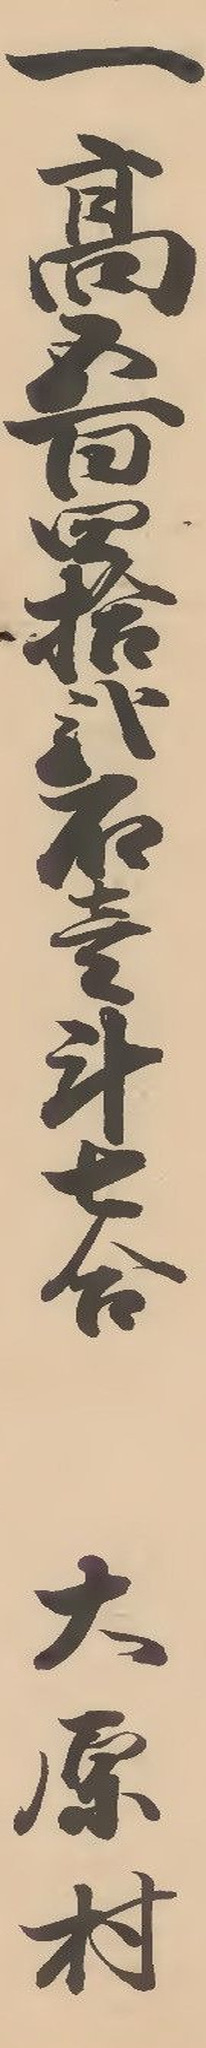一高五百四拾弐石壱斗七合大原村
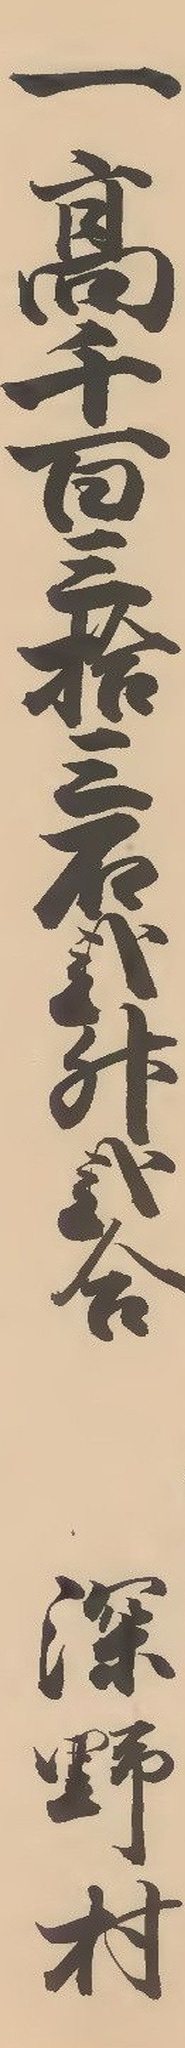一高千百三拾三石弐升弐合深野村
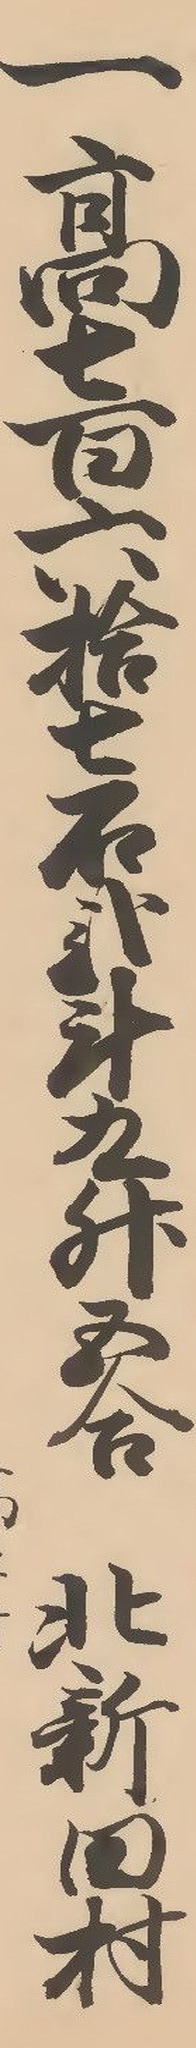一高七百六拾七石弐斗九升五合北新田村
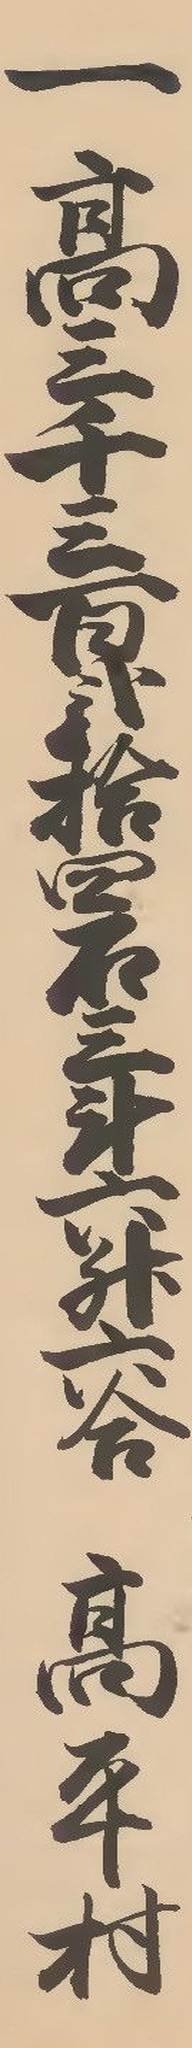一高三千三百弐拾四石三斗六升六合高平村
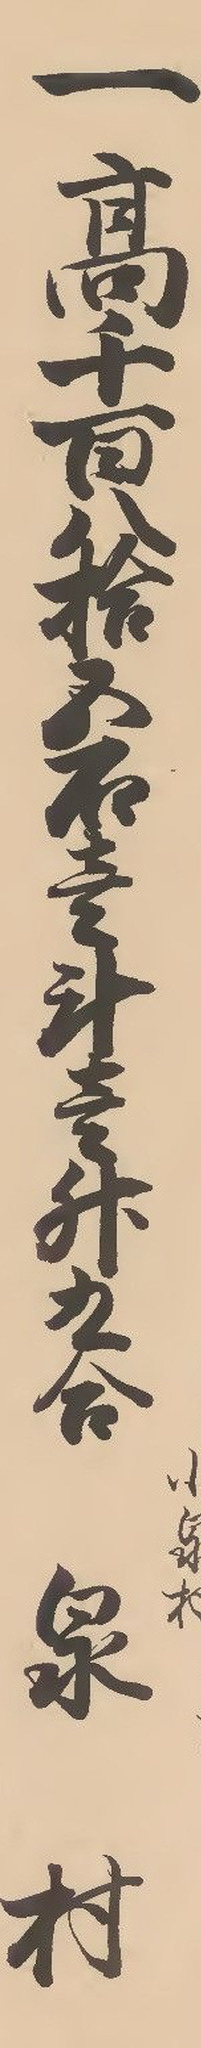一高千百八拾五石壱斗壱升九合泉村
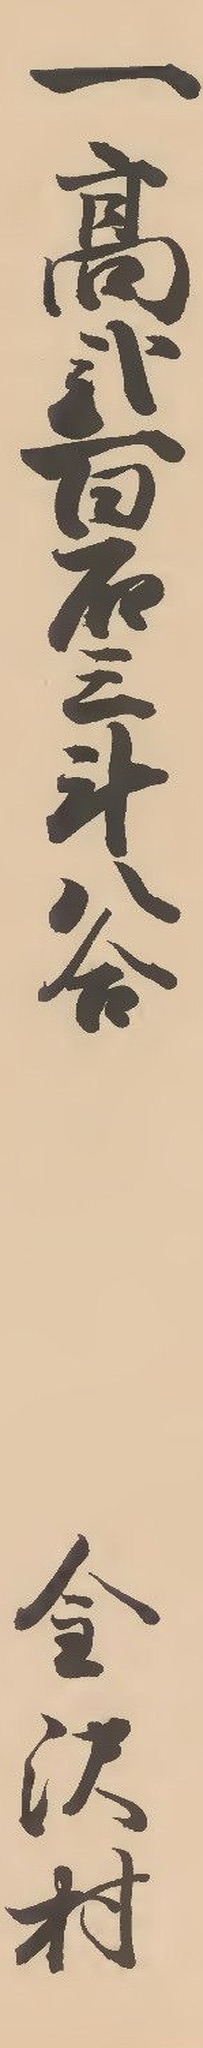一高弐百石三斗八合金沢村
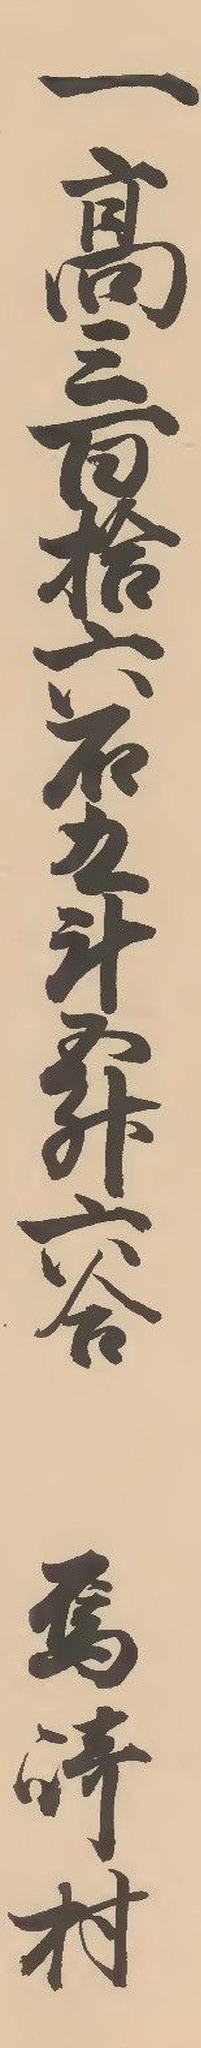一高三百拾六石九斗五升六合烏崎村
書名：陸奥国郷帳　３
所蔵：国立公文書館 National Archives of Japan
